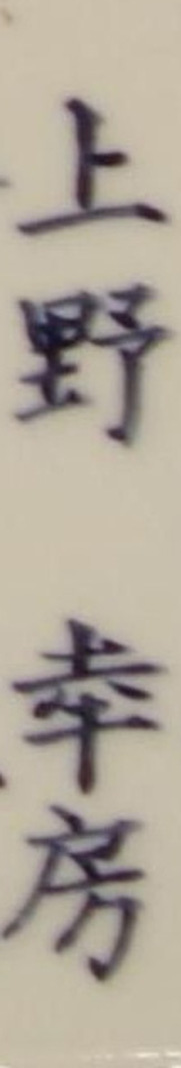上野幸房
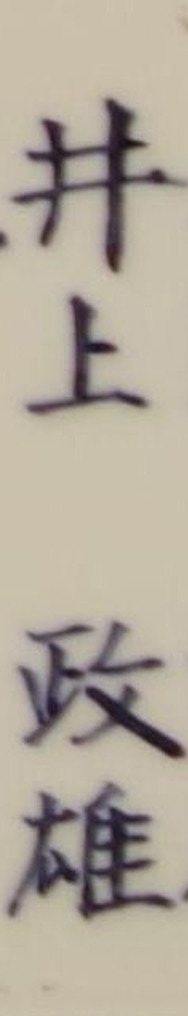井上政雄
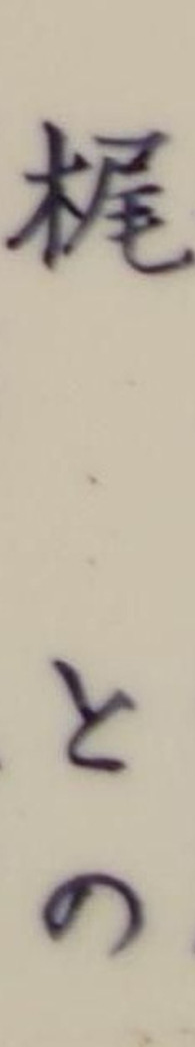梶との
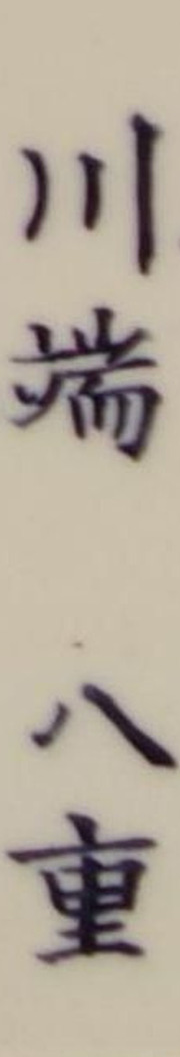川端八重
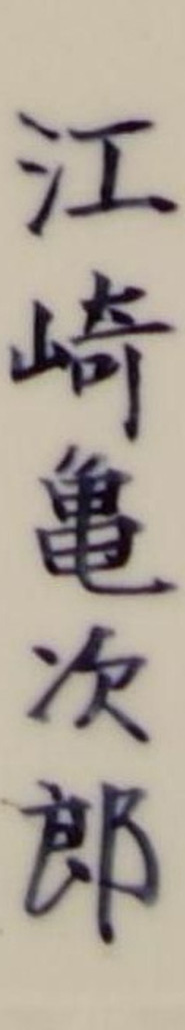江崎亀次郎
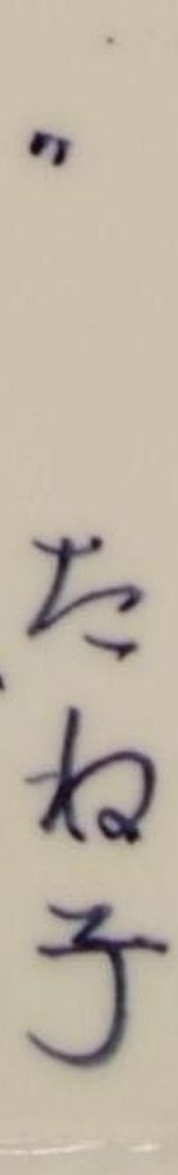たね子
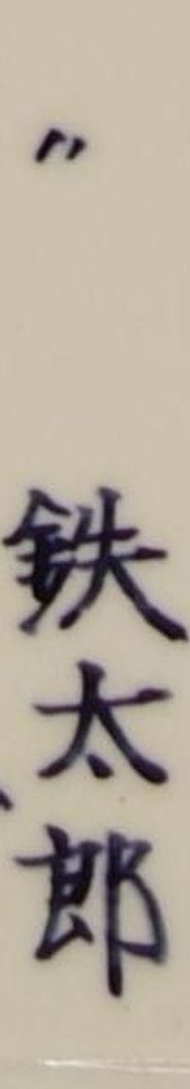鉄太郎
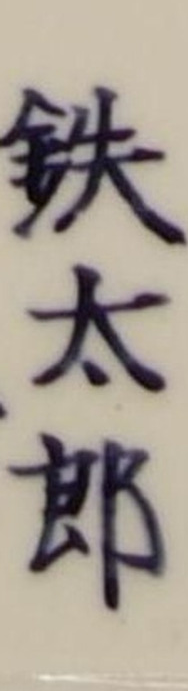鉄太郎
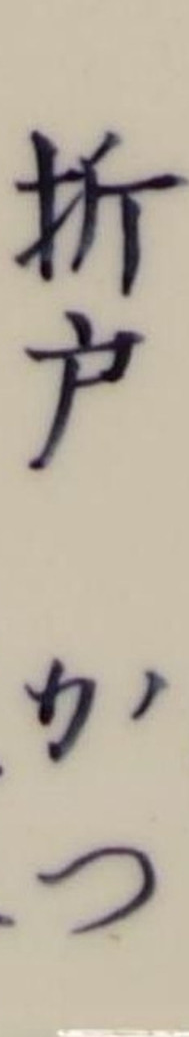折戸かつ
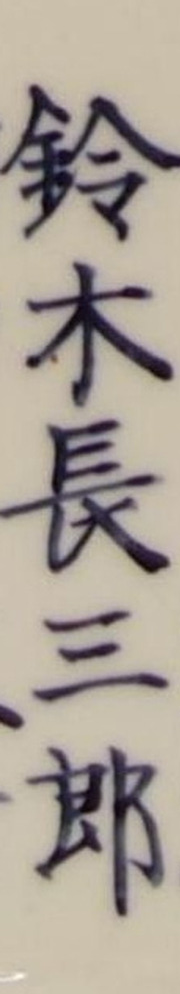鈴木長三郎
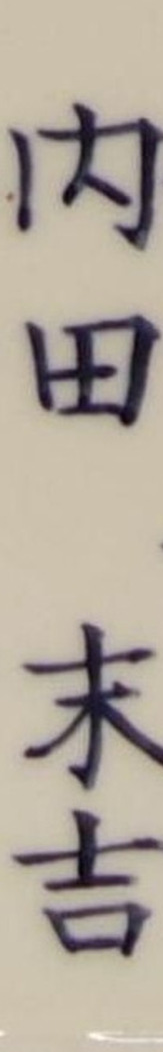内田末吉
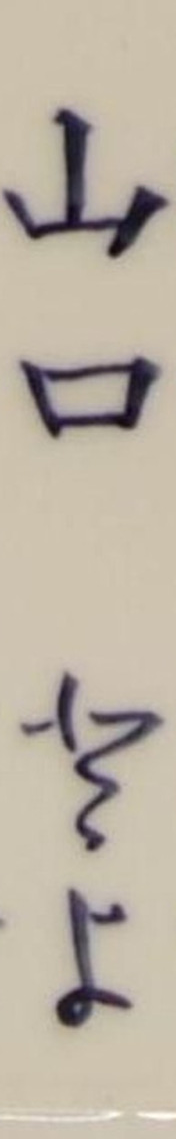山口とよ
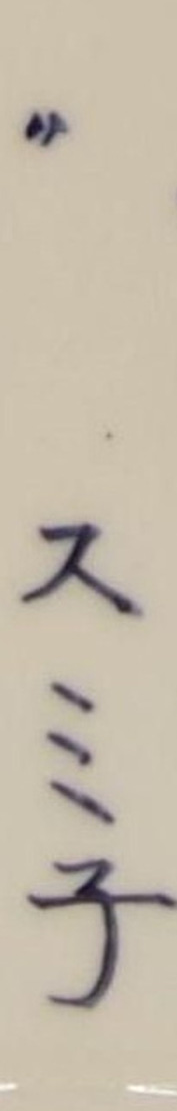スミ子
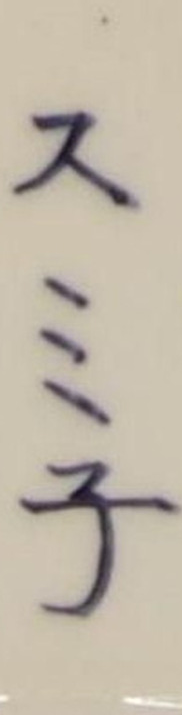スミ子
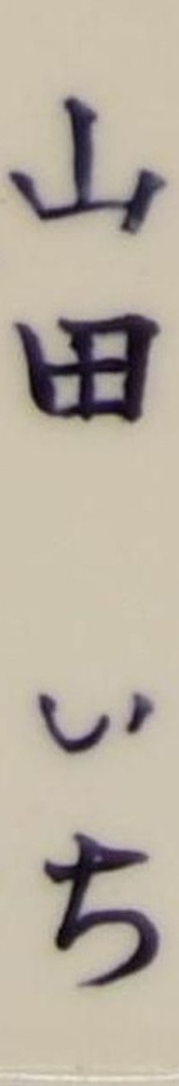山田いち
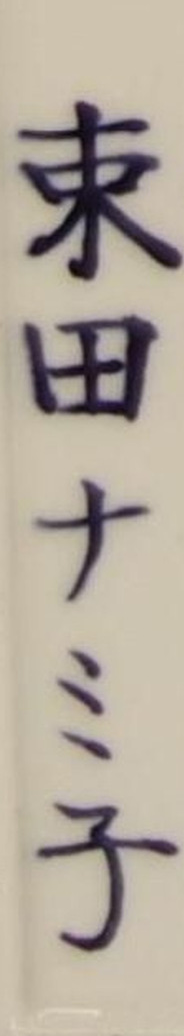束田ナミ子
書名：M~S
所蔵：高野山金剛峯寺
